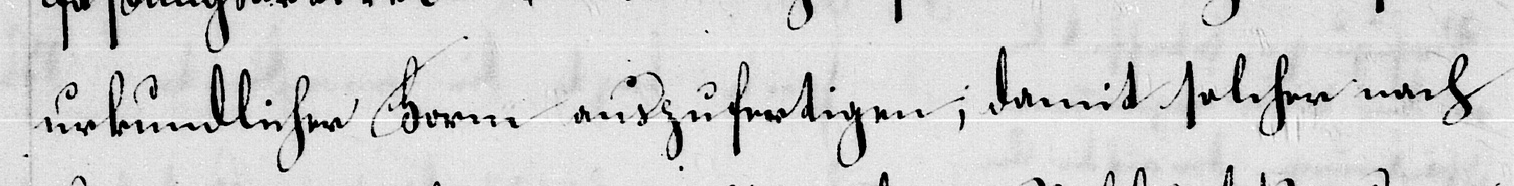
urkundlicher Form auszufertigen; damit solcher nach
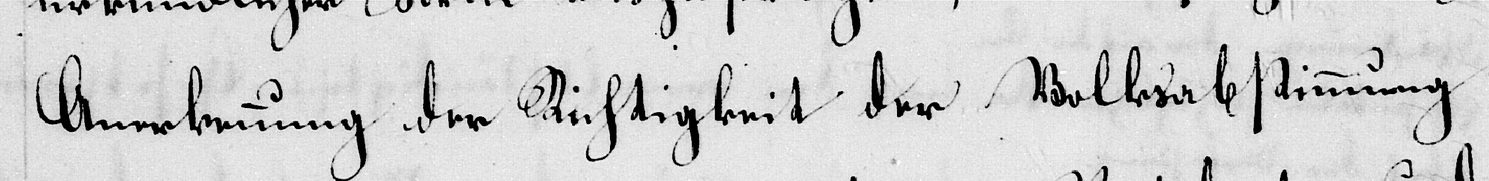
Anerkennung der Richtigkeit der Volksabstimmung
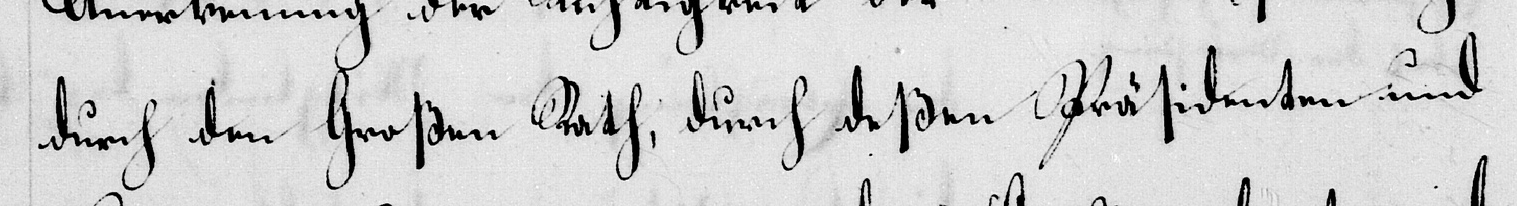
durch den Großen Rath, durch deßen Präsidenten und
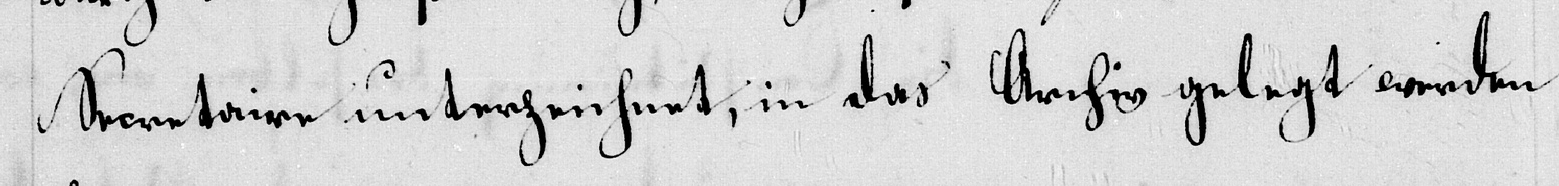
Secretaire unterzeichnet, in das Archiv gelegt werden
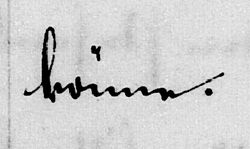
könne.
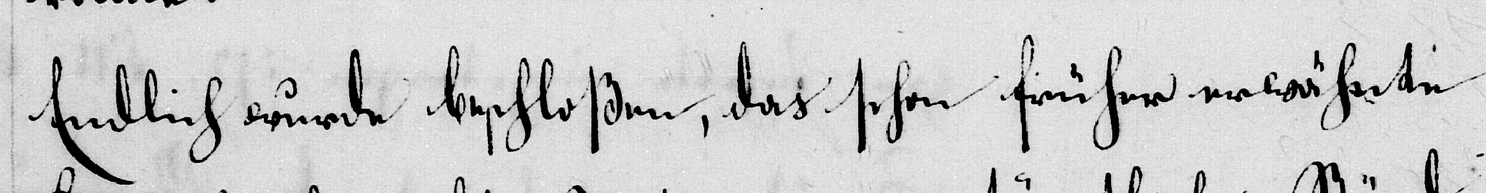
Endlich wurde beschloßen, das schon früher erwähnte
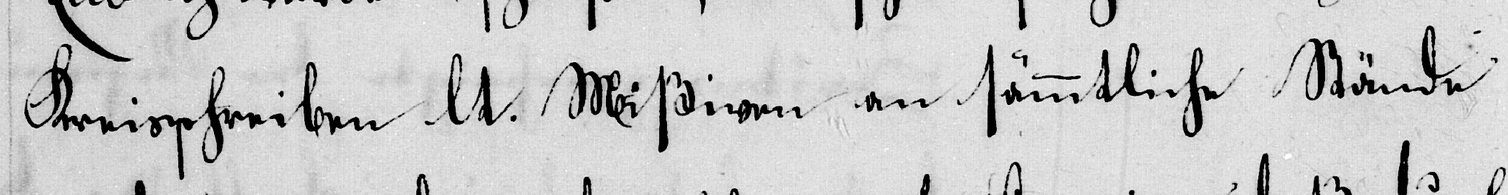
Kreisschreiben lt. Mißiven an sämmtliche Stände
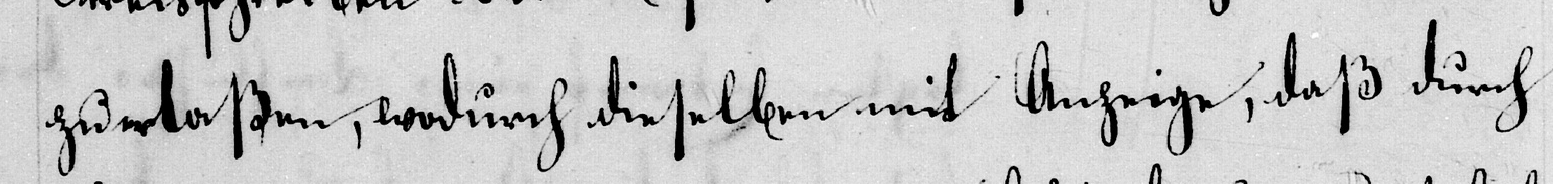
zu erlaßen, wodurch dieselben mit Anzeige, daß durch
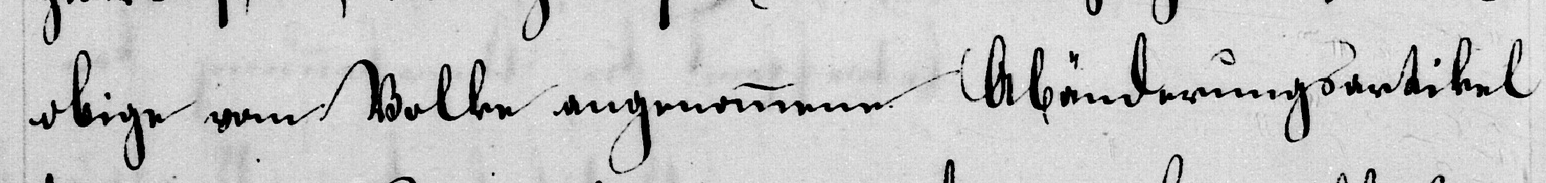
obige vom Volke angenommenen Abänderungsartikel
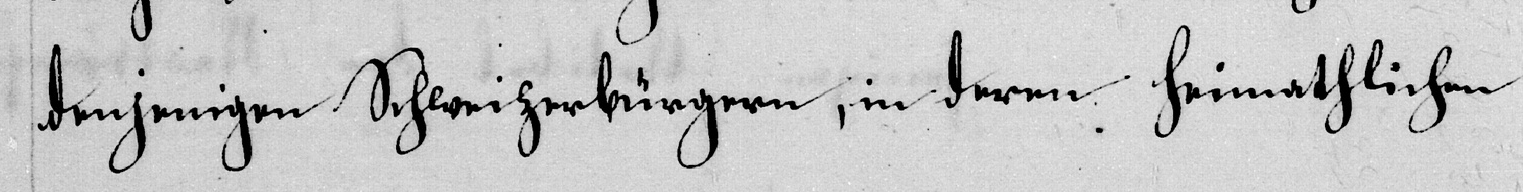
denjenigen Schweizerbürgern, in deren heimathlichen
